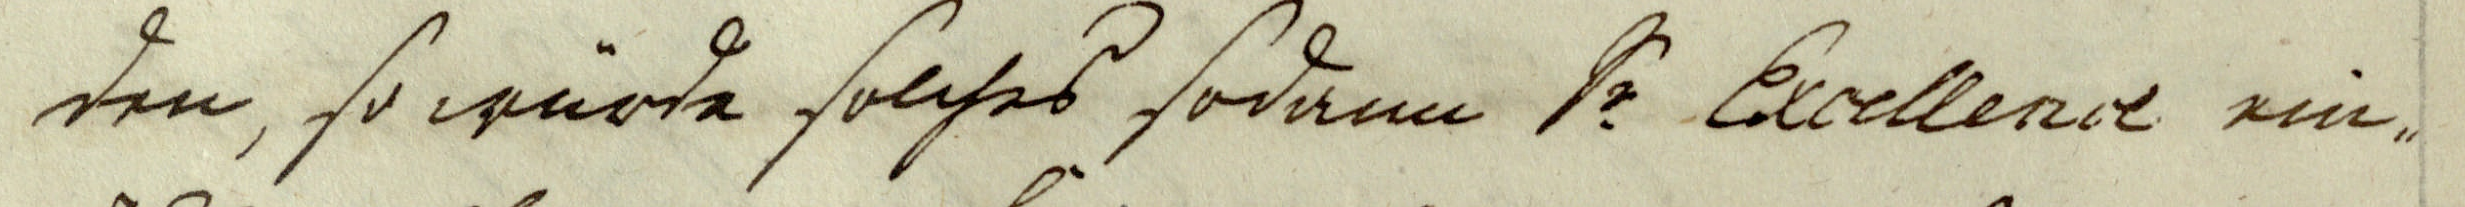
den, so würde solches sodann Sr. Excellence ein¬
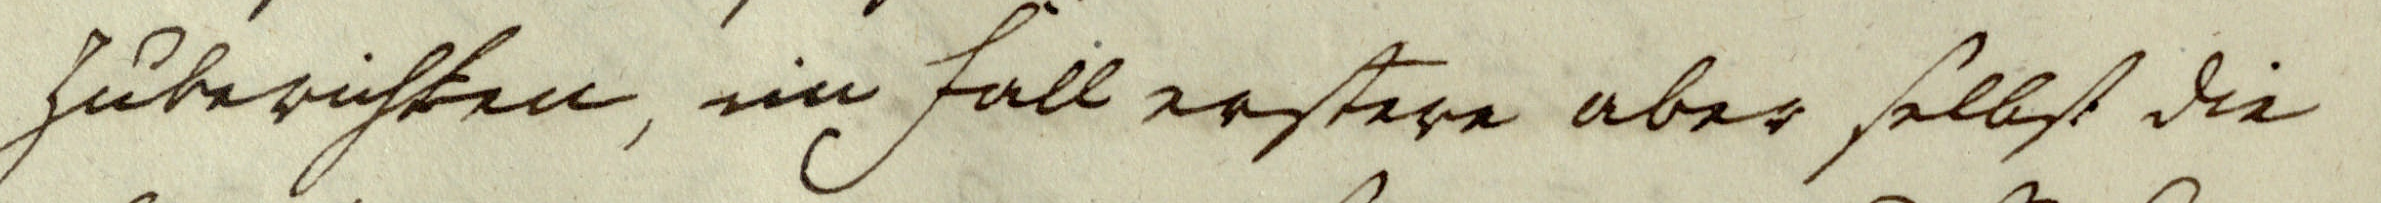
zuberichten, im Fall erstere aber selbst die
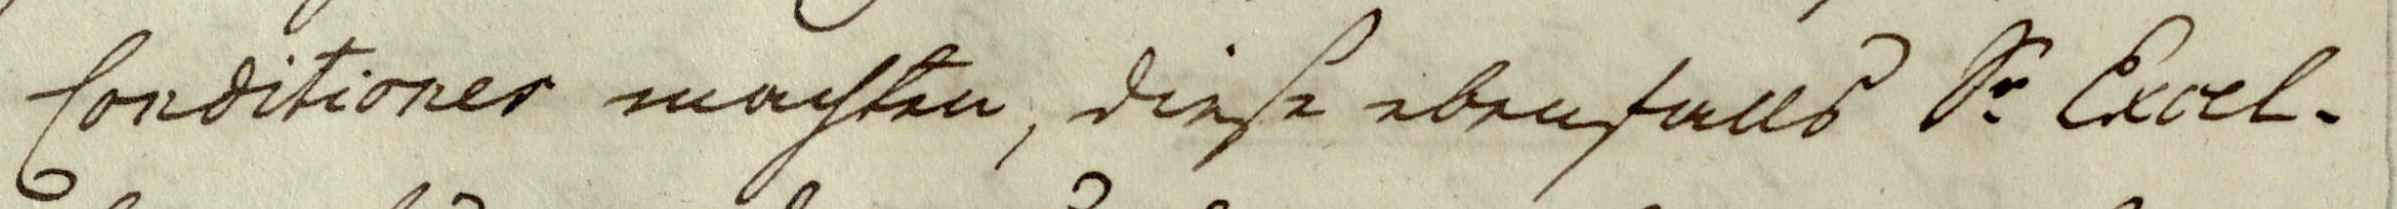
Conditiones machten, diese ebenfalls Sr. Excel¬
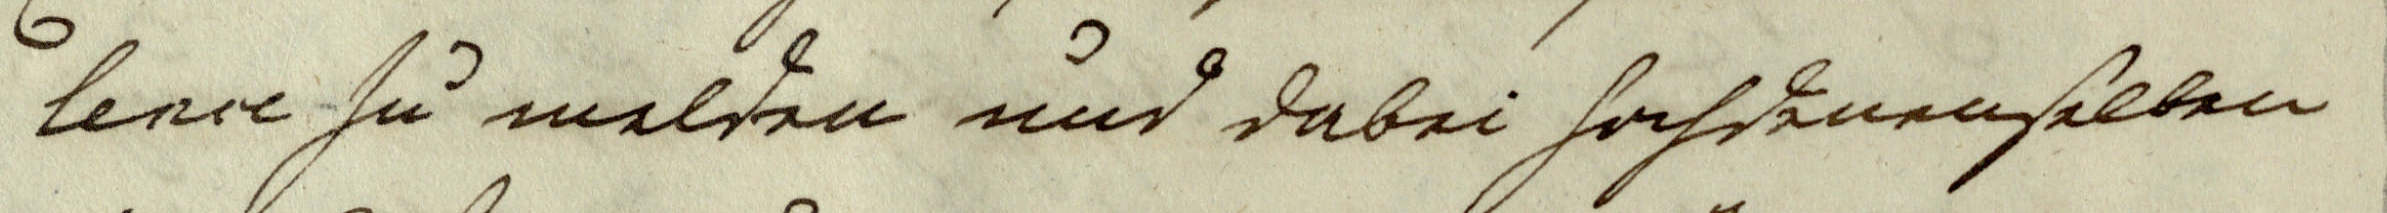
lence zu melden und dabei hochdenenselben
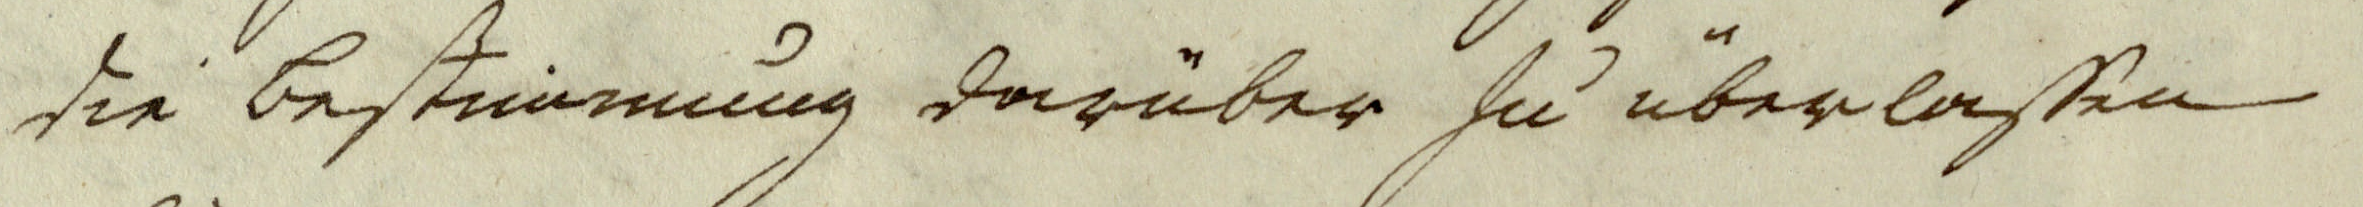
die Bestimmung darüber zu überlassen
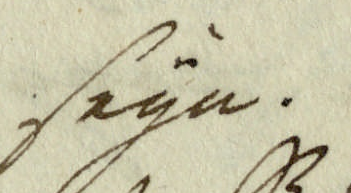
seÿn.
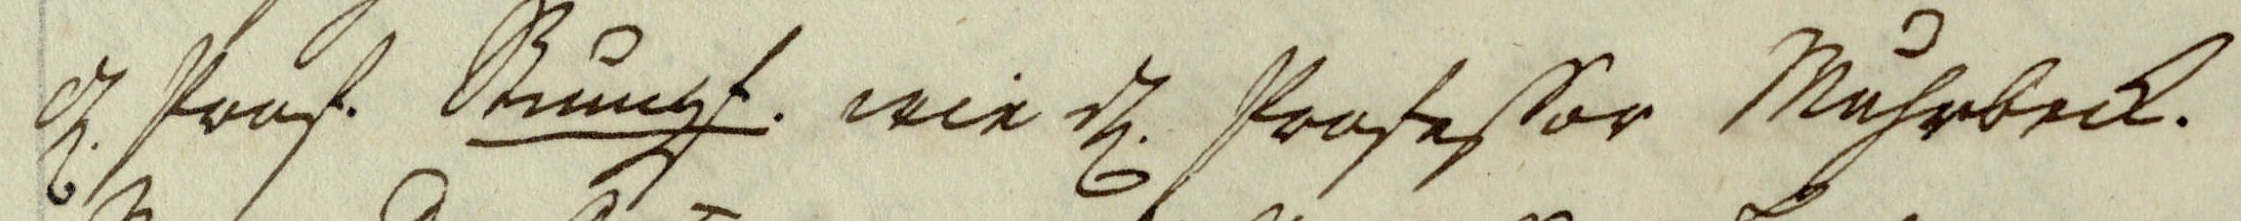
dh. Prof. Stumpf. wie dh. Professor Muhrbeck.
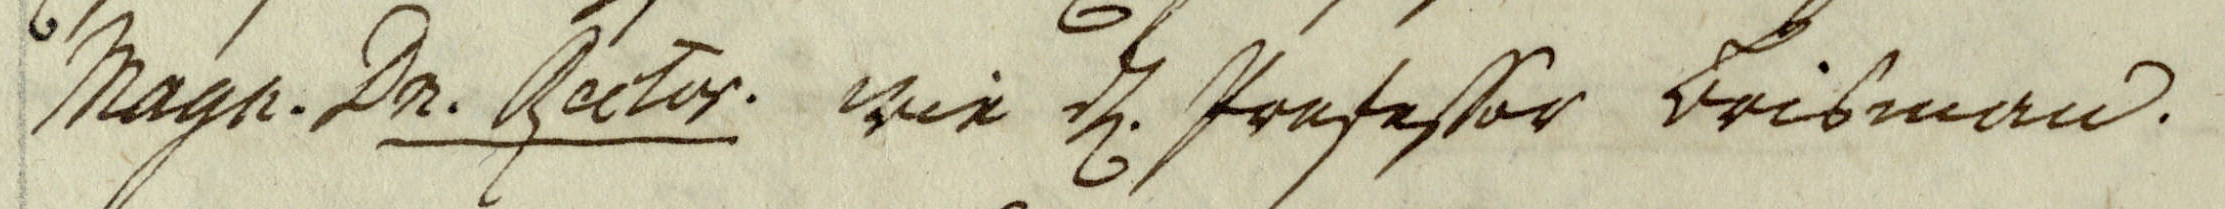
Magn. Dn. Rector. wie dh. Professor Brismann.
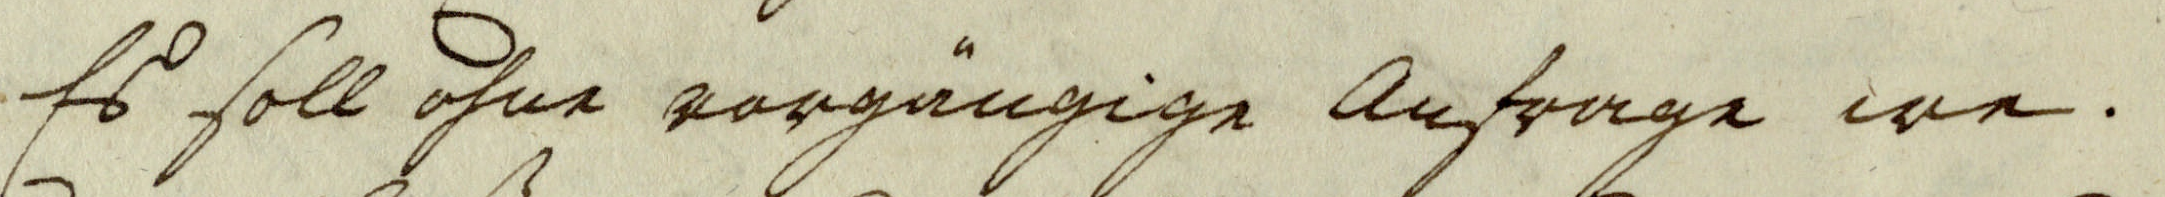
Es soll ohne vorgängige Anfrage we¬
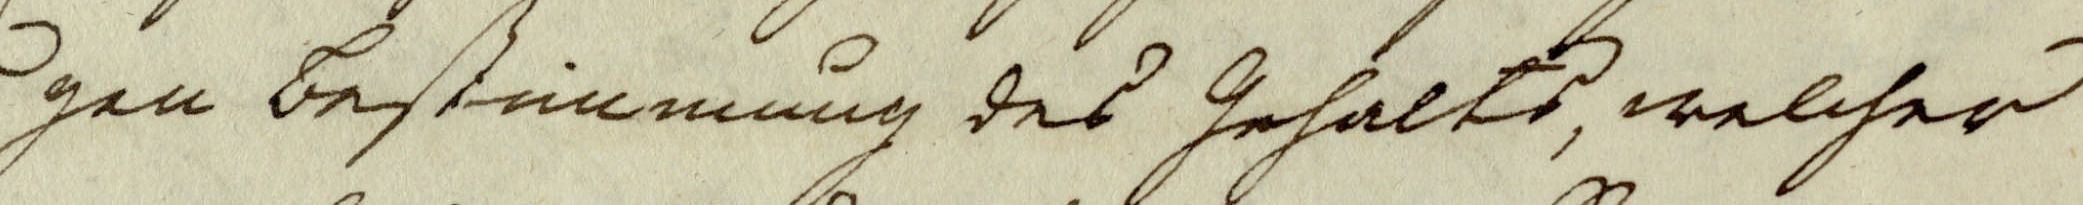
gen Bestimmung des Gehalts, welcher
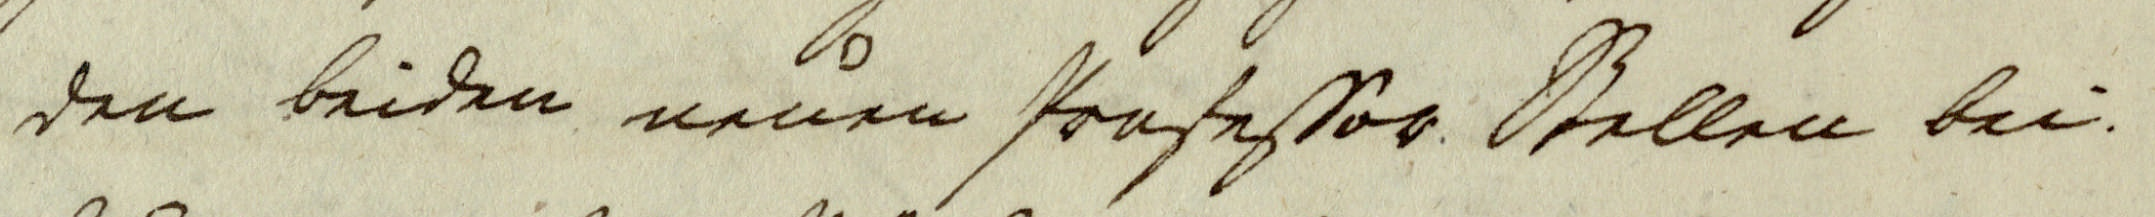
den beiden neuen Professor Stellen bei¬
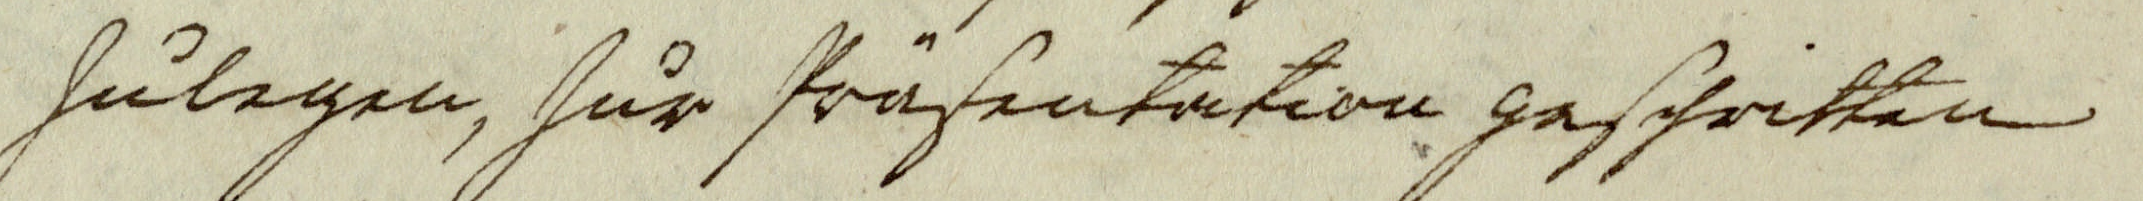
zulegen, zur Präsentation geschritten
